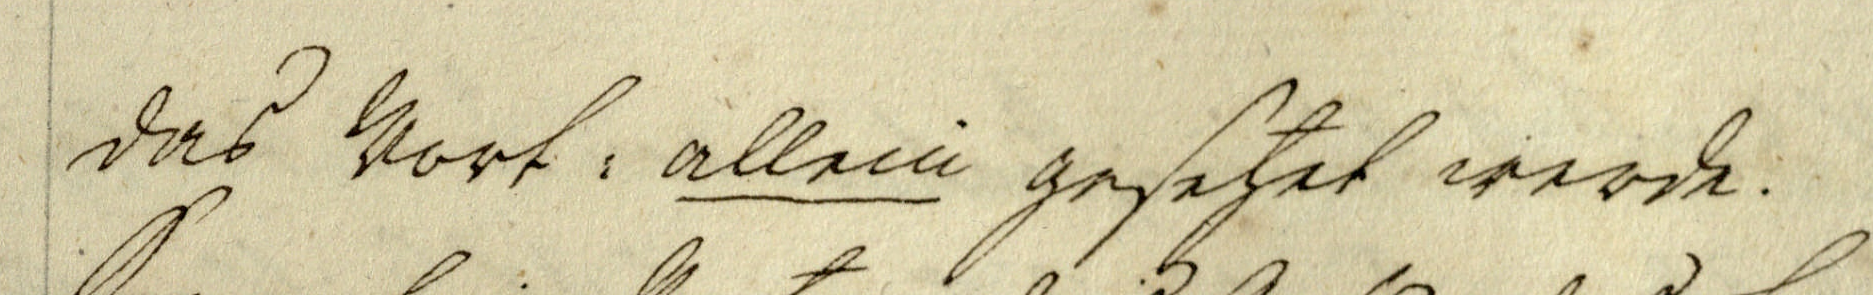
das Wort: allein gesetzet werde.
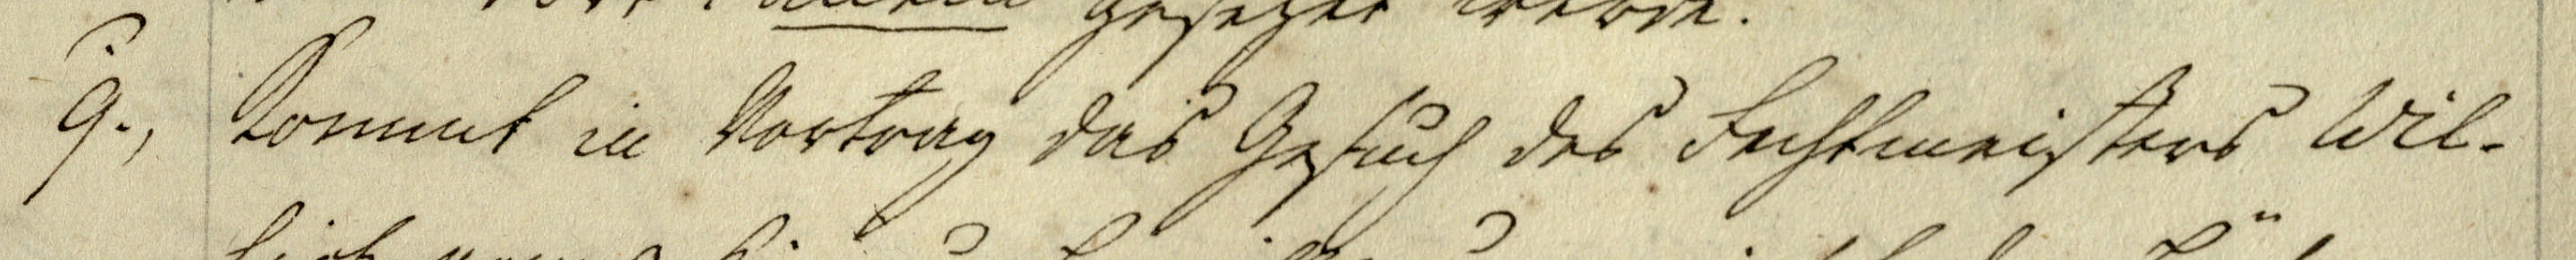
9., Kommt in Vortrag das Gesuch des Fechtmeisters Wil¬
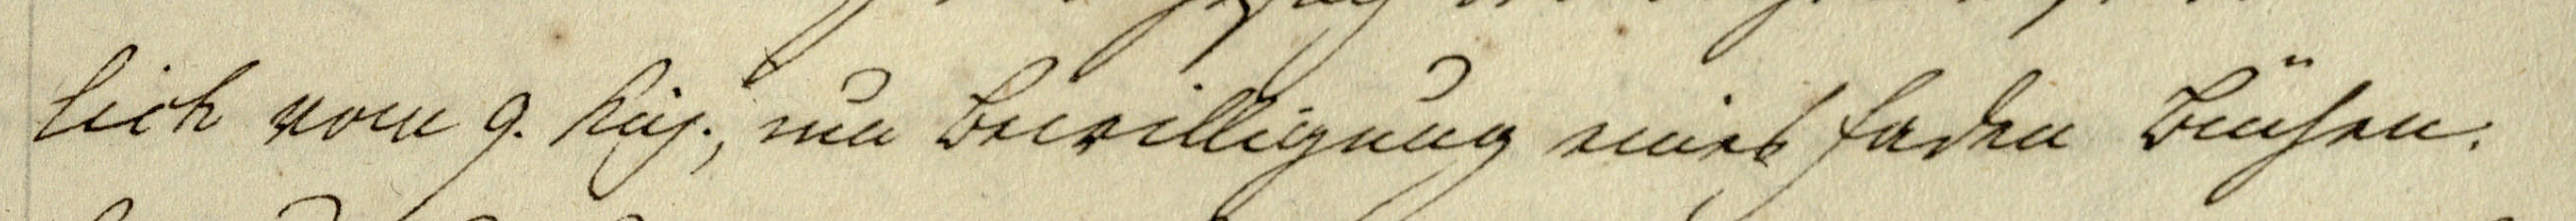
lich vom 9. huj., um Bewilligung eines Faden Büchen¬
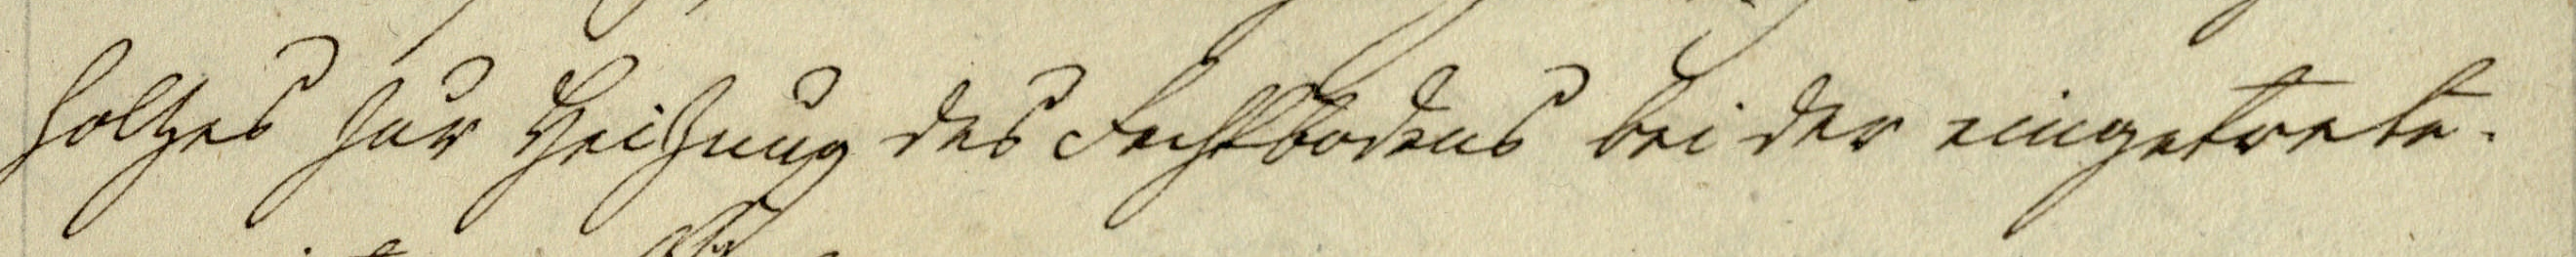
holzes zur Heizung des Fechtbodens bei der eingetrete¬
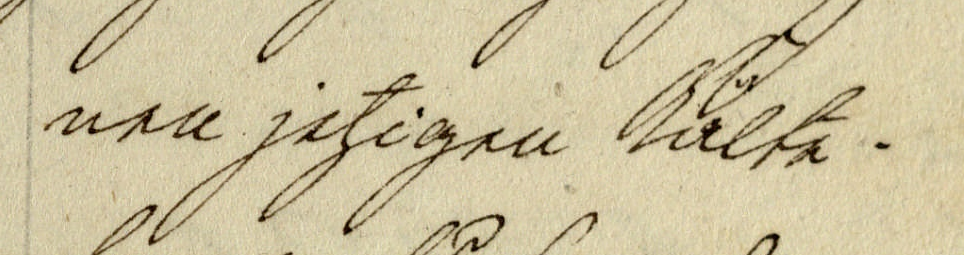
nen jetzigen Kälte.
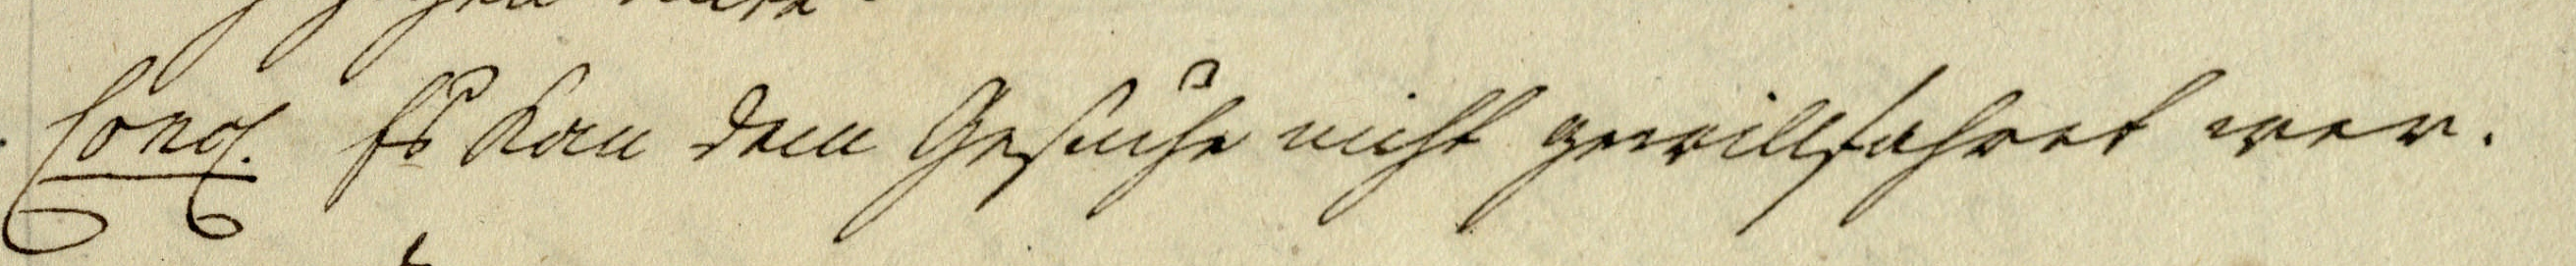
Concl. Es kan dem Gesuche nicht gewillfahret wer¬
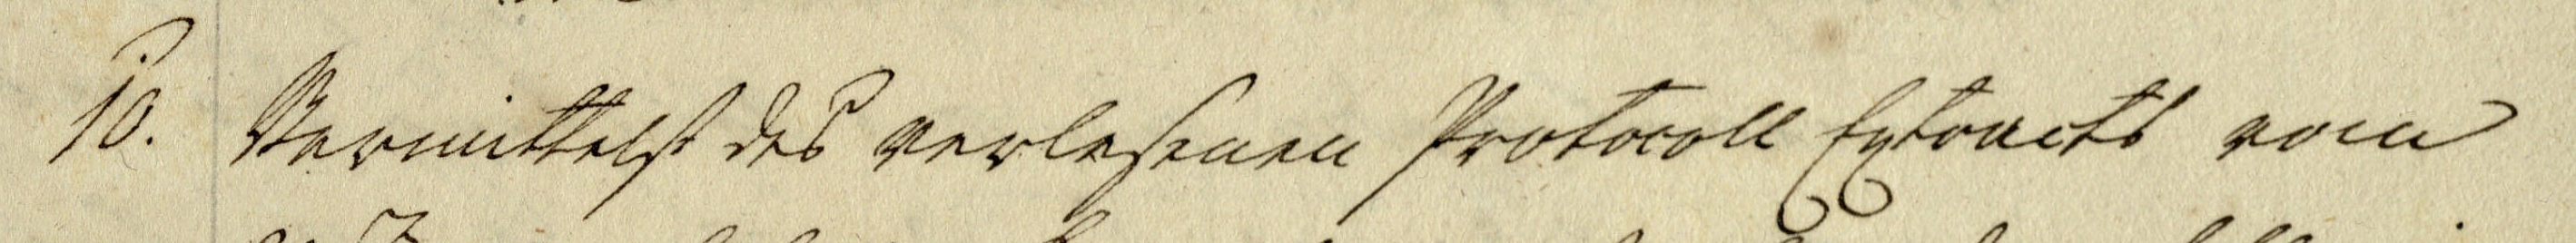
10. Vermittelst des verlesenen Protocoll Extracts vom
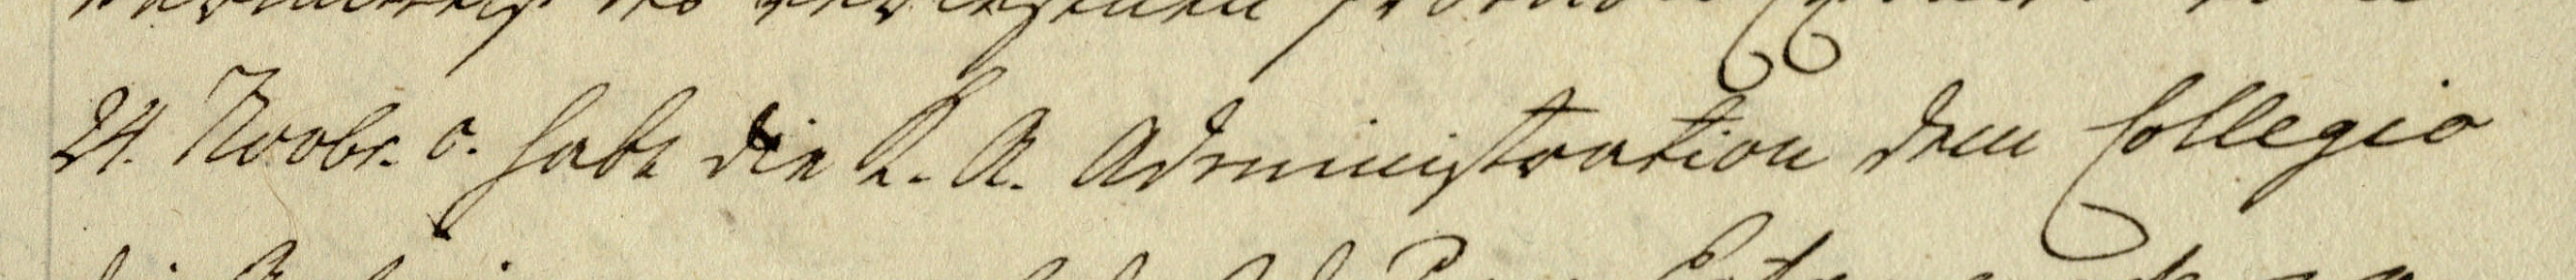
24. Novbr. c. habe die K. A. Administration dem Collegio
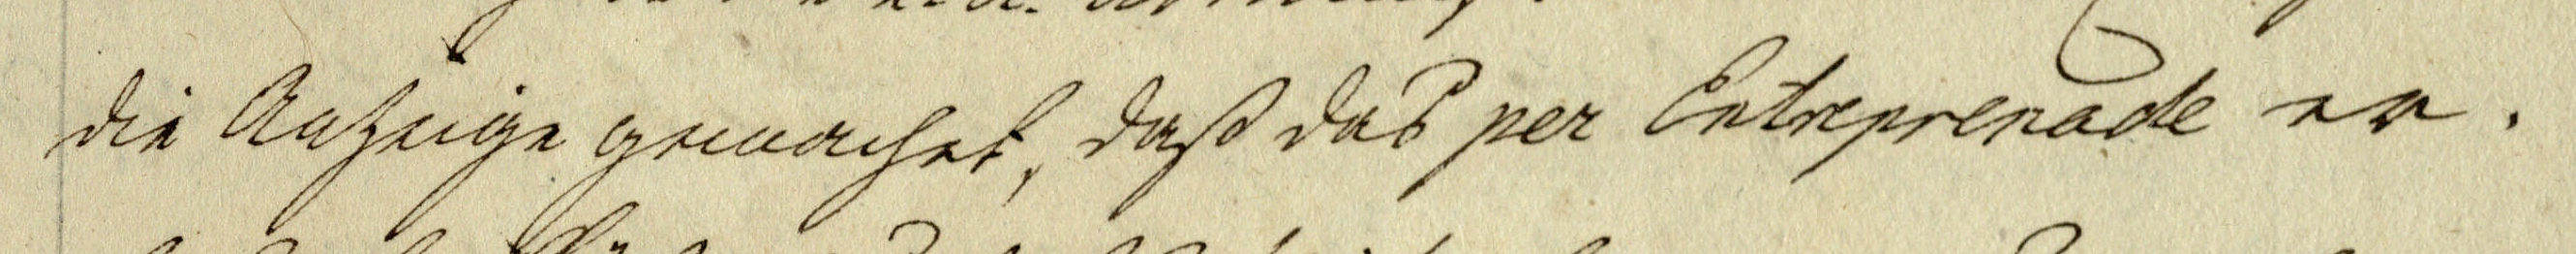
die Anzeige gemachet, daß das per Entreprenade er¬
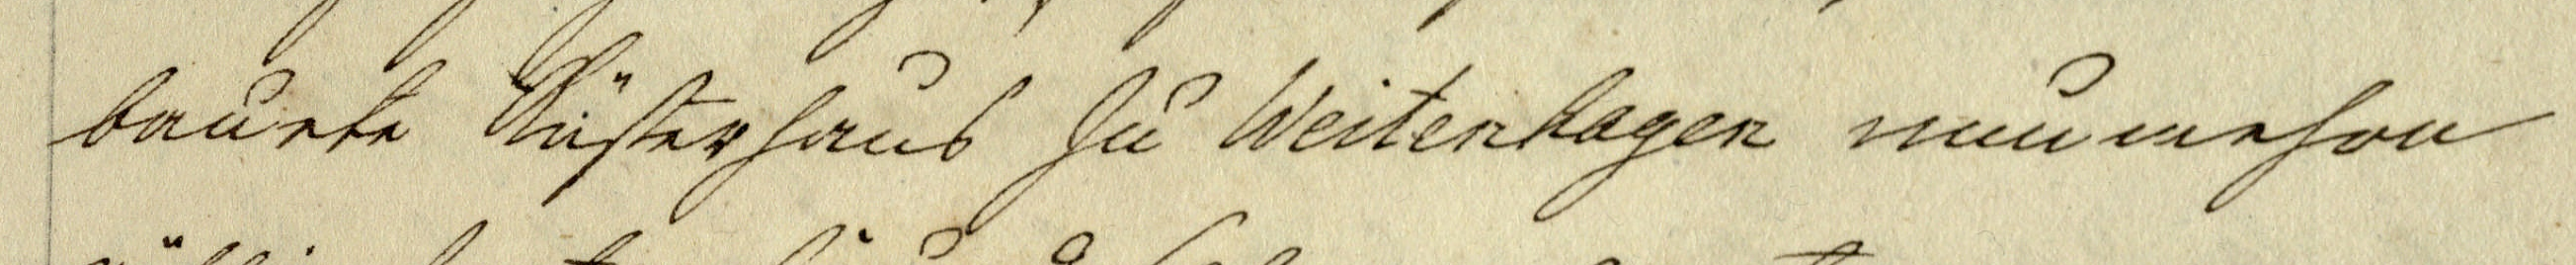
bauete Küsterhaus zu Weitenhagen nunmehro
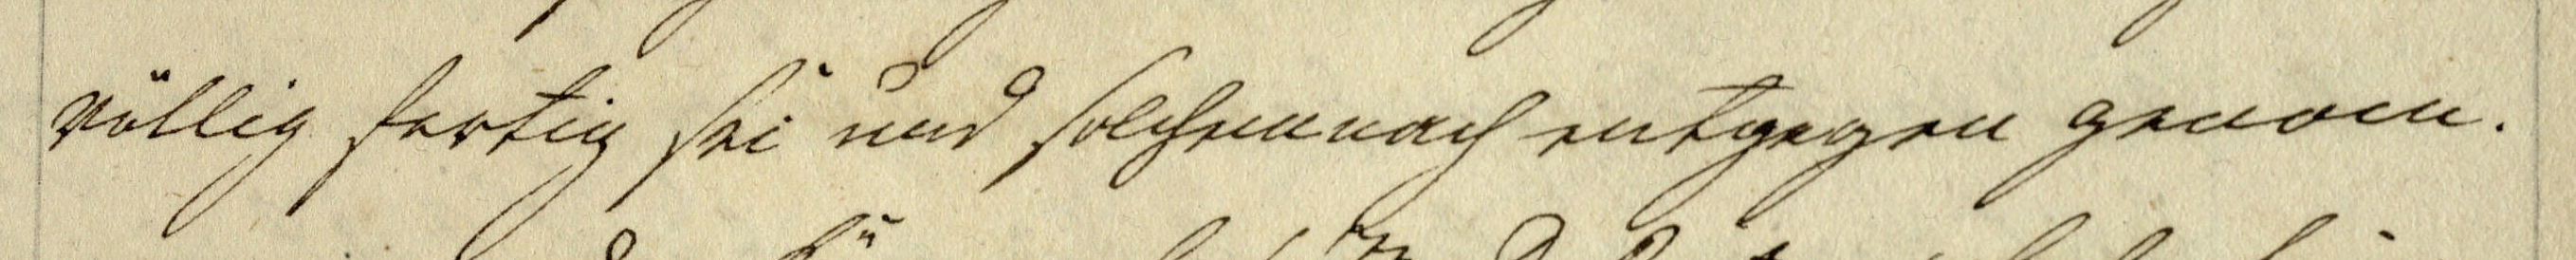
völlig fertig sei und solchemnach entgegen genom¬
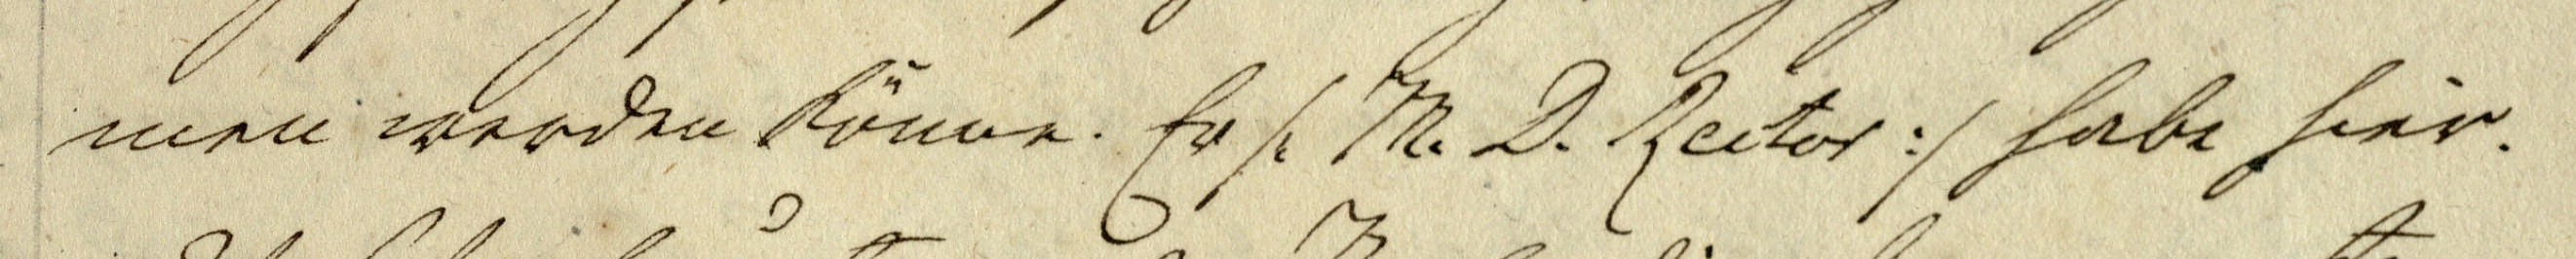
men werden könne Er /. M. D. Rector :/ habe hier¬
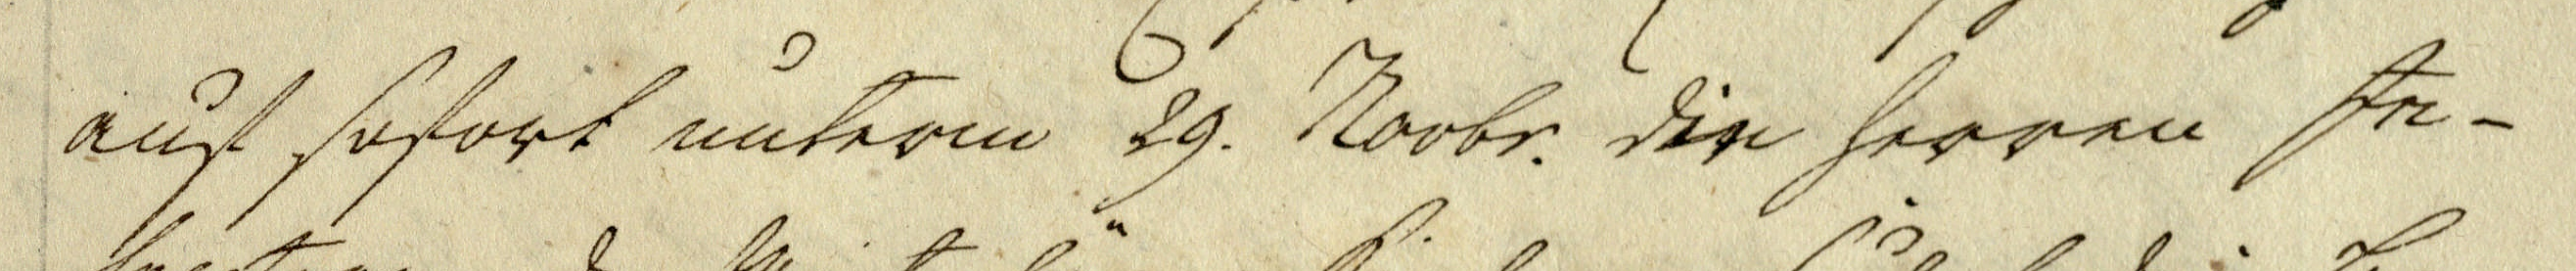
auf sofort unterm 29. Novbr. der Herren In¬
